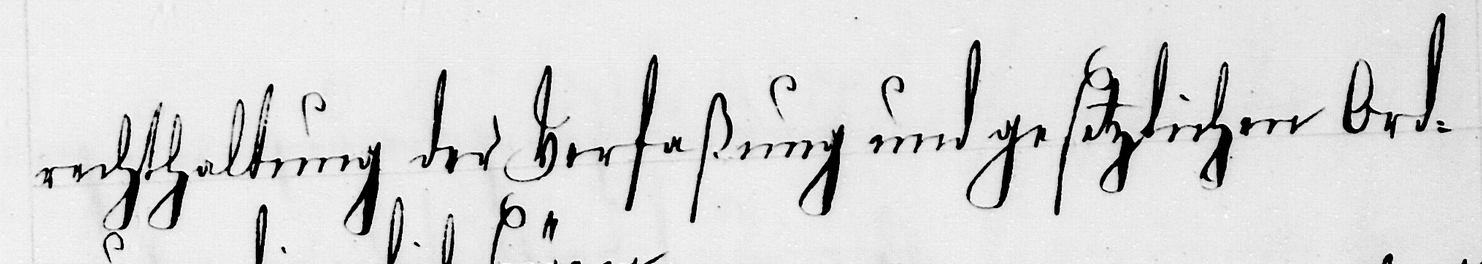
rechthaltung der Verfaßung und gesetzlichen Ord¬
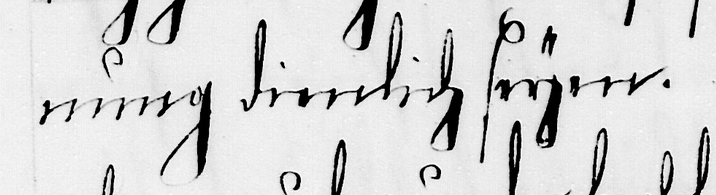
nung dienlich seyen.
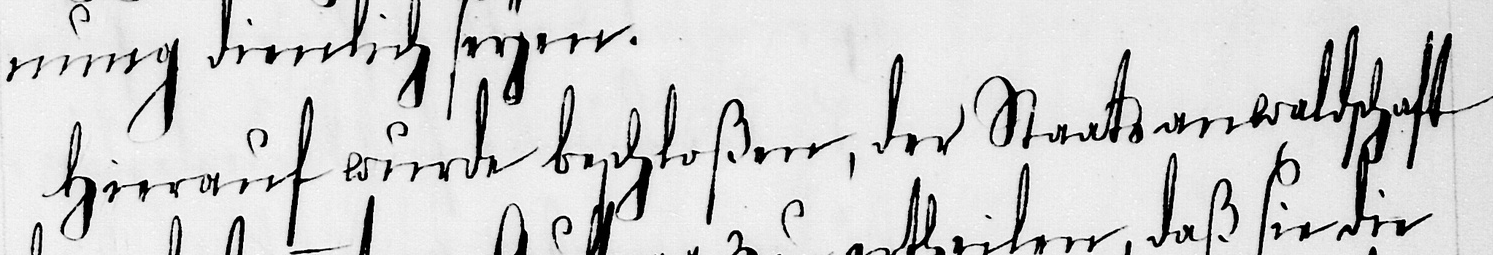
Hierauf wurde beschloßen, der Staatsanwaldschaft
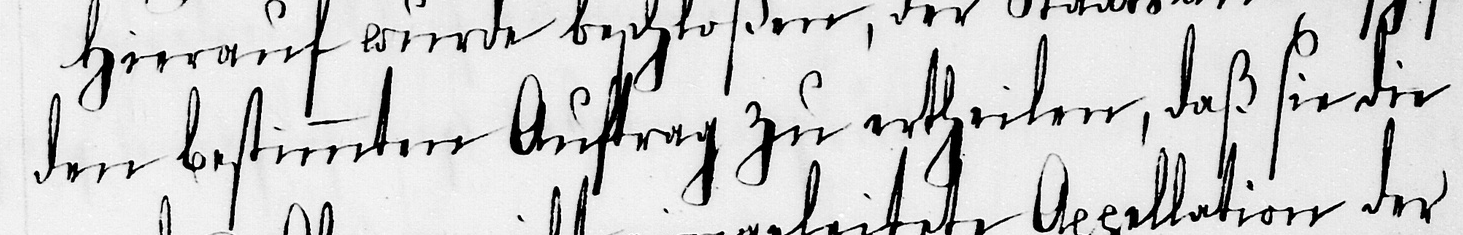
den bestimmten Auftrag zu ertheilen, daß sie die
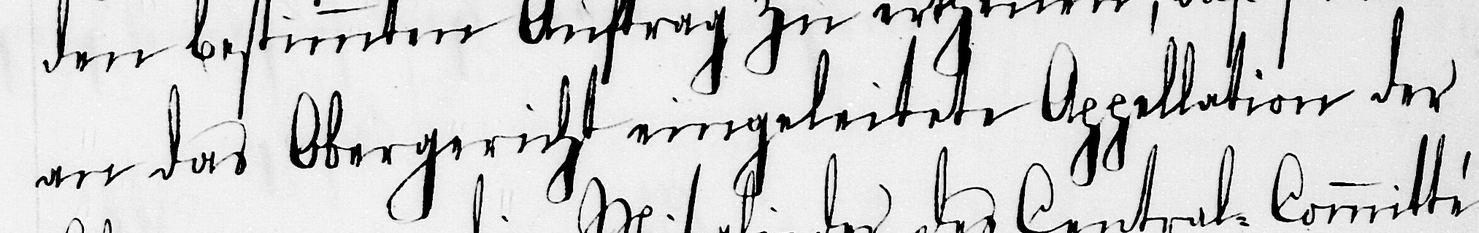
an das Obergericht eingeleitete Appellation der
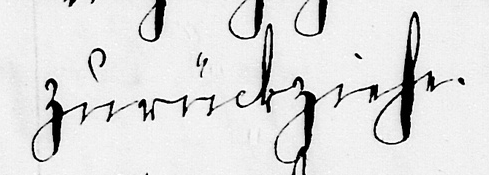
zurückziehe.
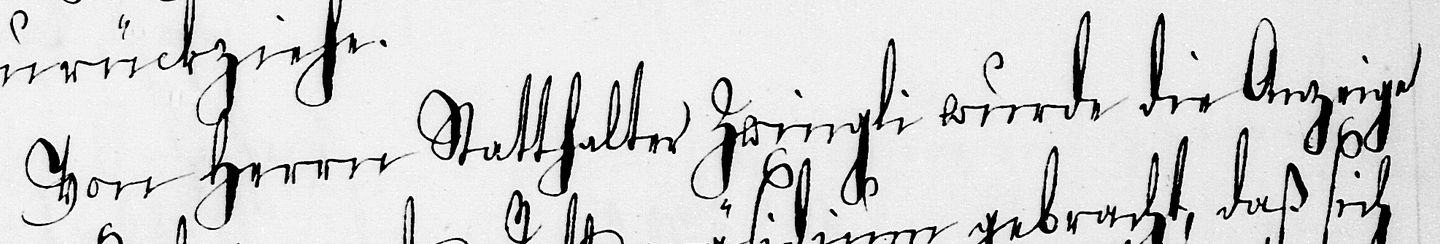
Von Herrn Statthalter Zwingli wurde die Anzeige
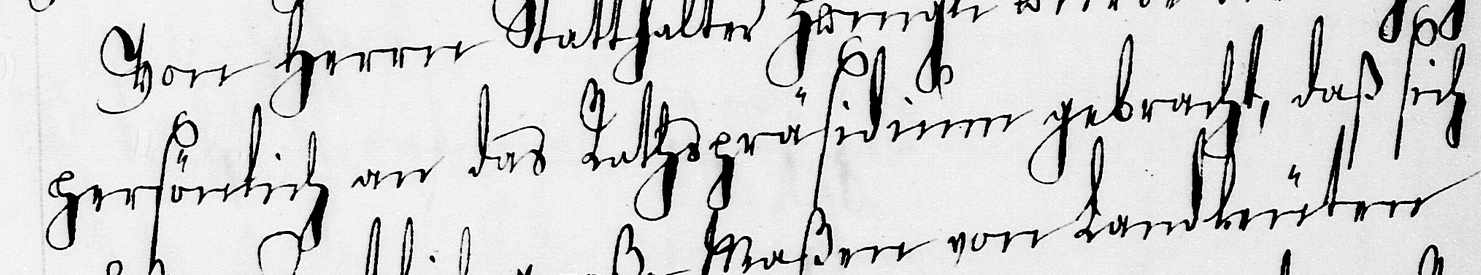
persönlich an das Rathspräsidium gebracht, daß sich
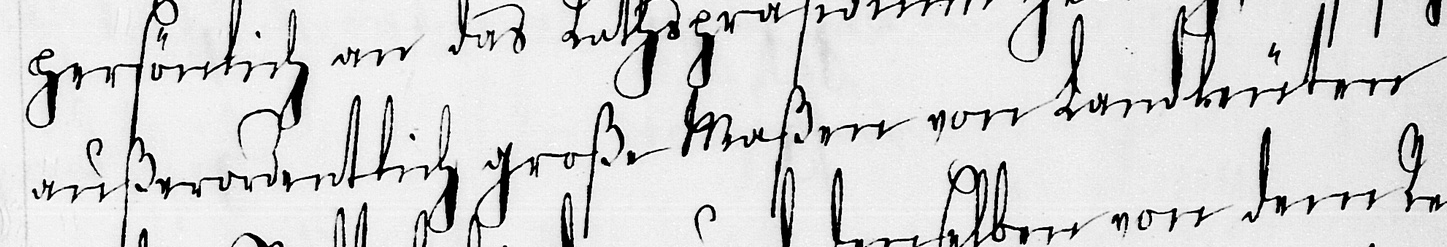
außerordentlich große Maßen von Landleuten
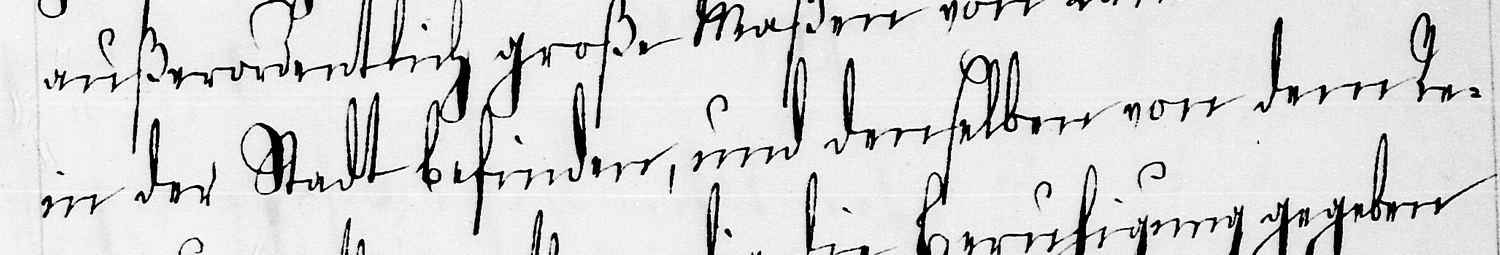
in der Stadt befinden, und denselben von dem Re¬
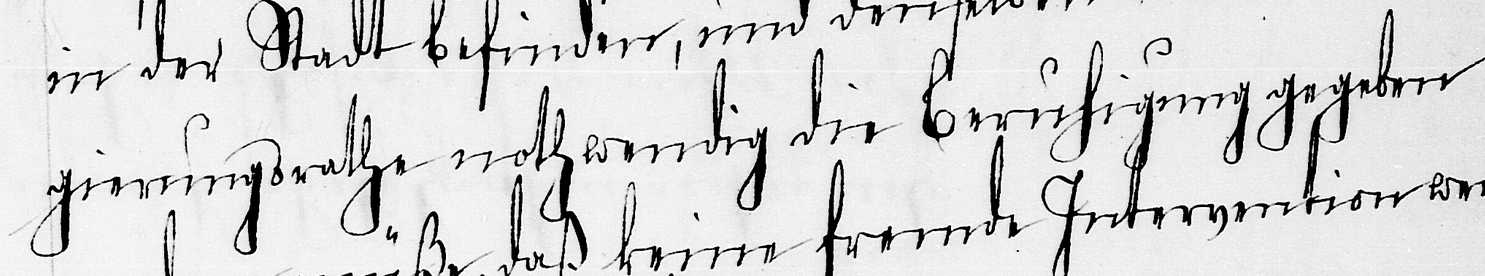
gierungsrathe nothwendig die Beruhigung gegeben
